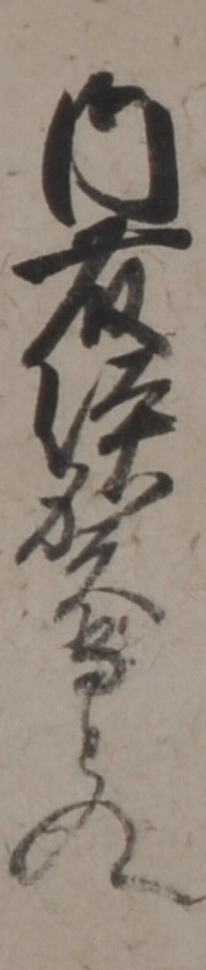内藤伊賀守とのへ

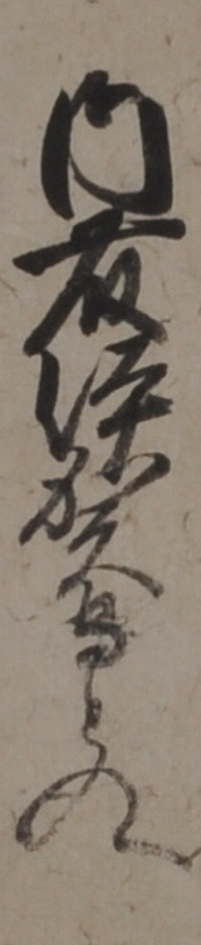内藤伊賀守とのへ

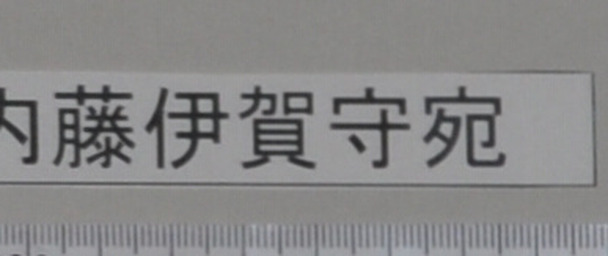内藤伊賀守殿
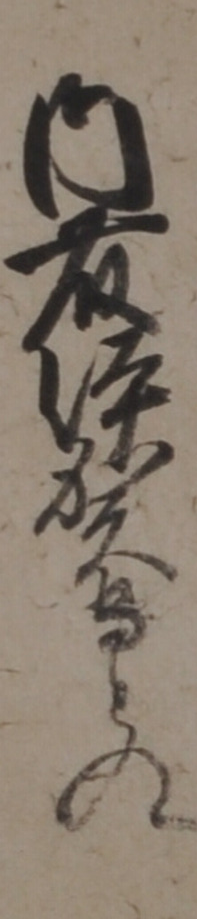内藤伊賀守殿
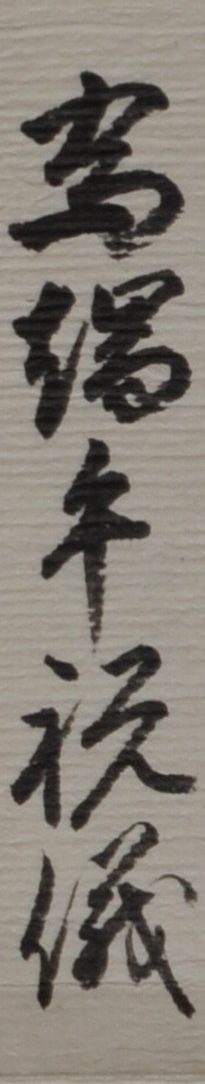為端午祝儀
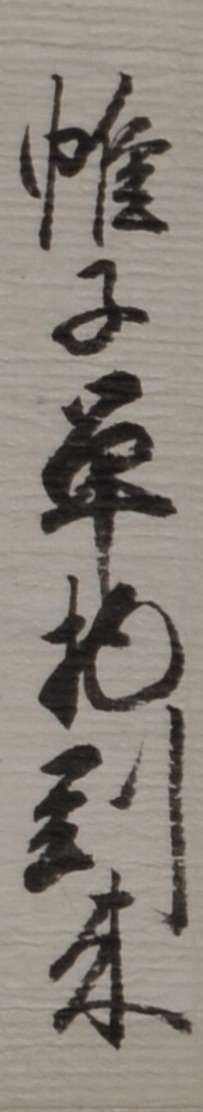帷子単物到来
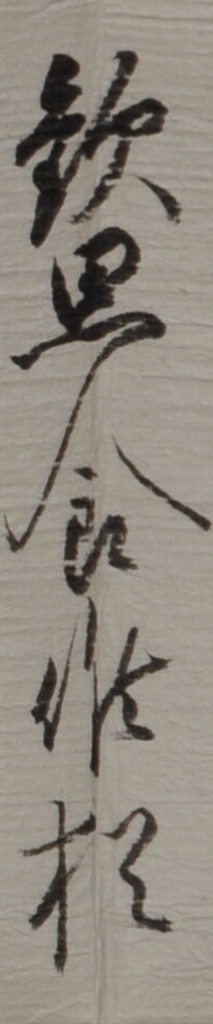歓思食候猶
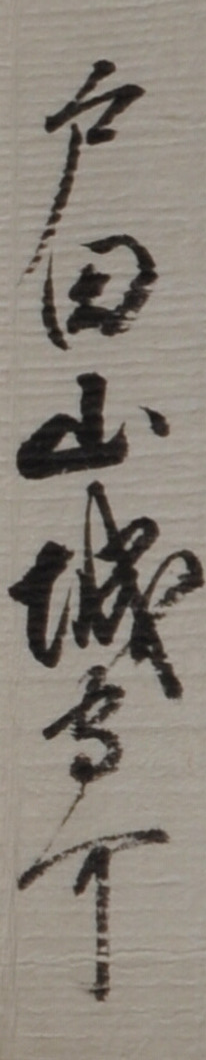戸田山城守可
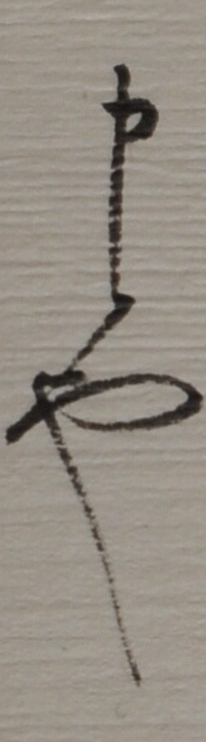申候也
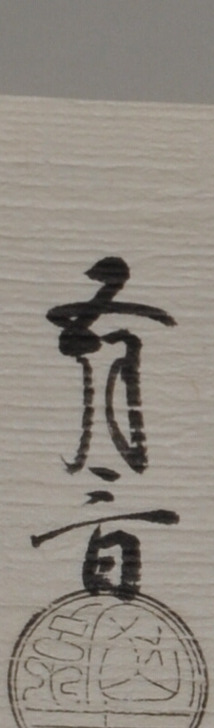五月三日
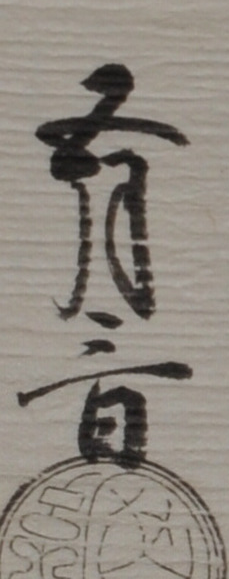五月三日
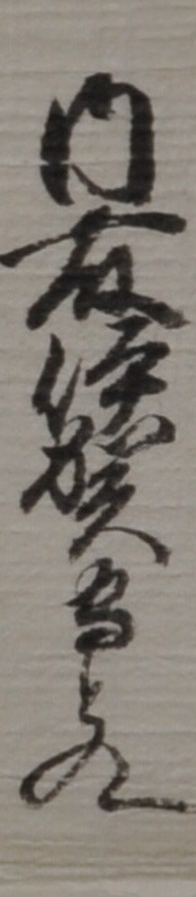内藤伊賀守殿
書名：御内書
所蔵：伊那市立高遠町図書館・合同会社AMANE
